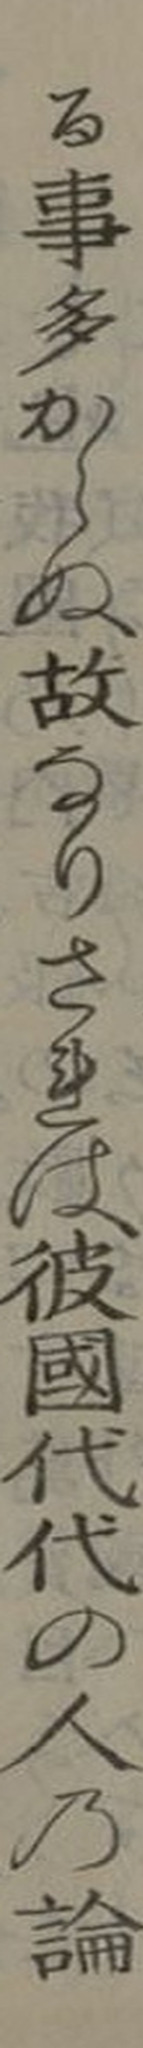る事多からぬ故なりされは彼國代代の人の論
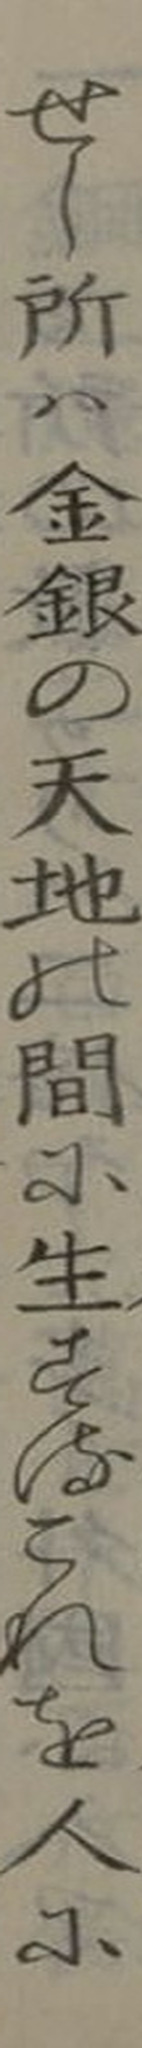せし所は金銀の天地の間に生するこれを人に
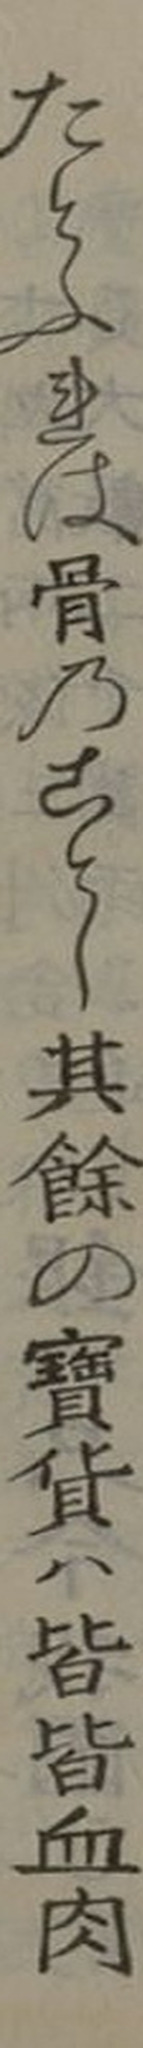たとふれは骨のことし其餘の寶貨は皆皆血肉
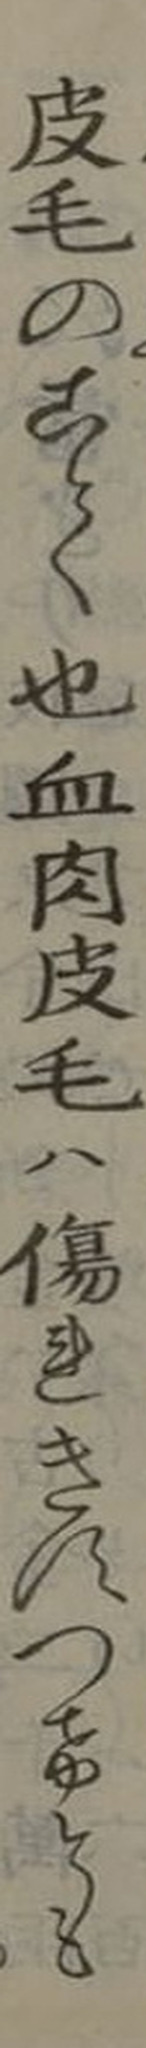皮毛のことく也血肉皮毛は傷れきすつけとも
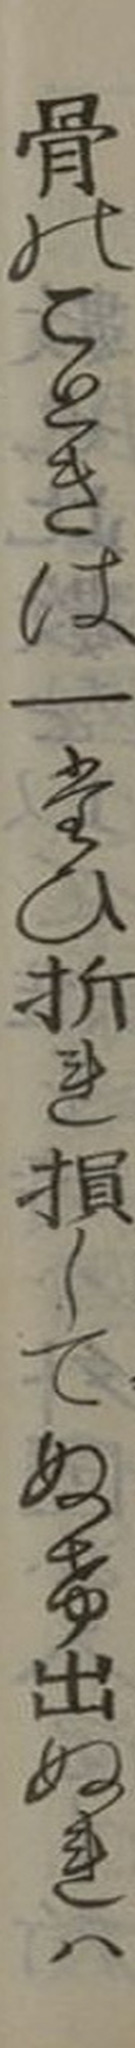骨のこときは一たひ折れ損してぬけ出ぬれは
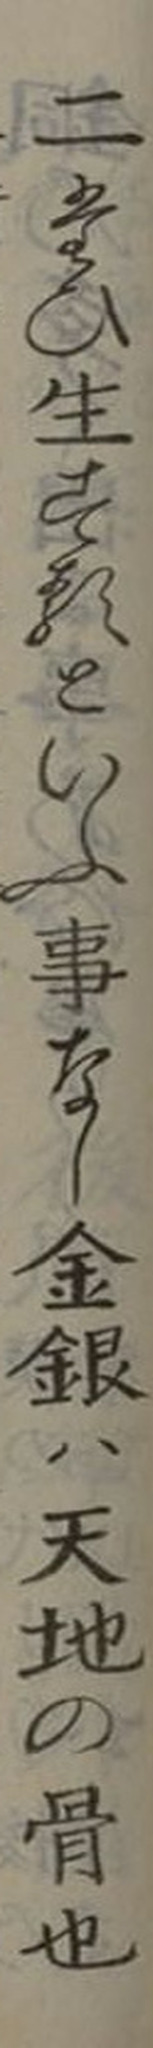二たひ生するといふ事なし金銀は天地の骨也
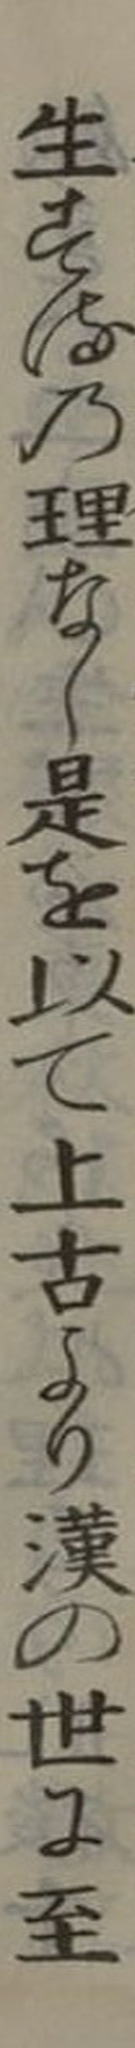生するの理なし是を以て上古より漢の世に至
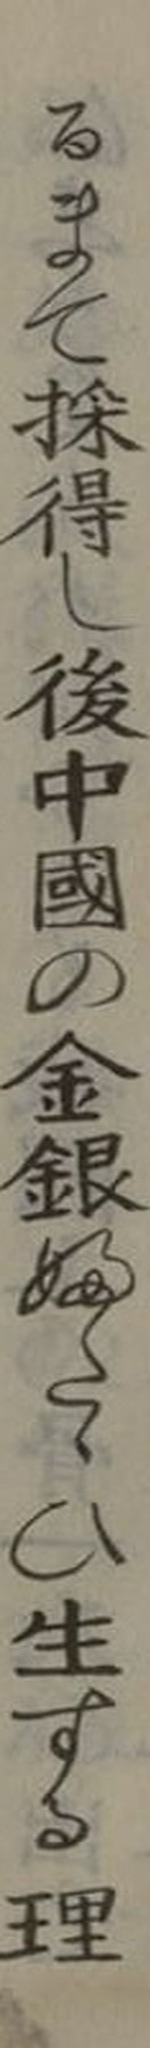るまて採得し後中國の金銀ふたゝひ生する理
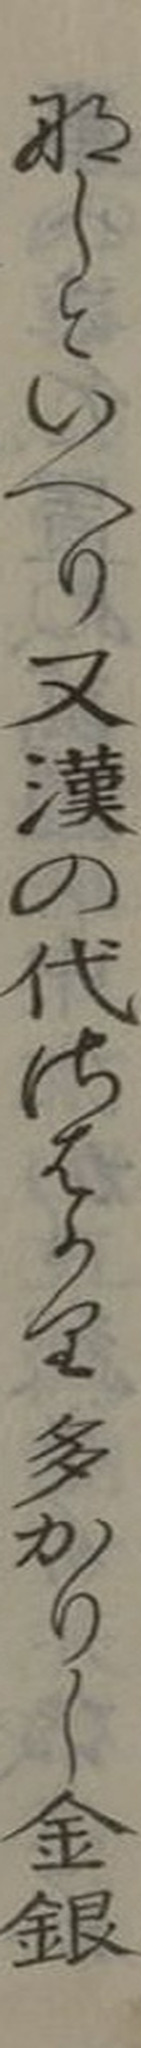なしといへり又漢の代さはかり多かりし金銀
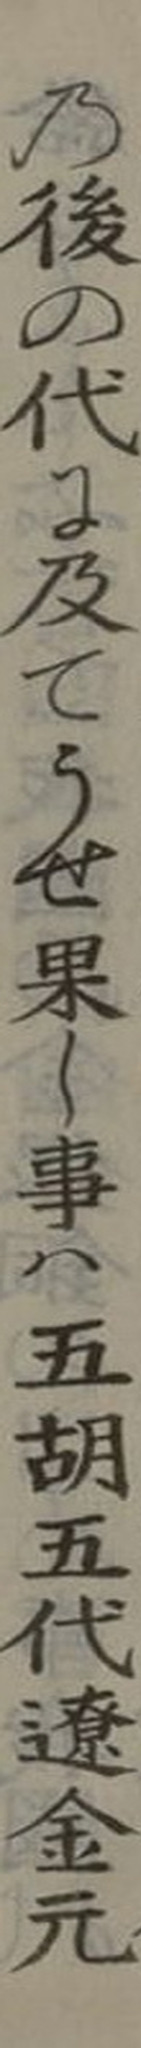の後の代に及てうせ果し事は五胡五代遼金元
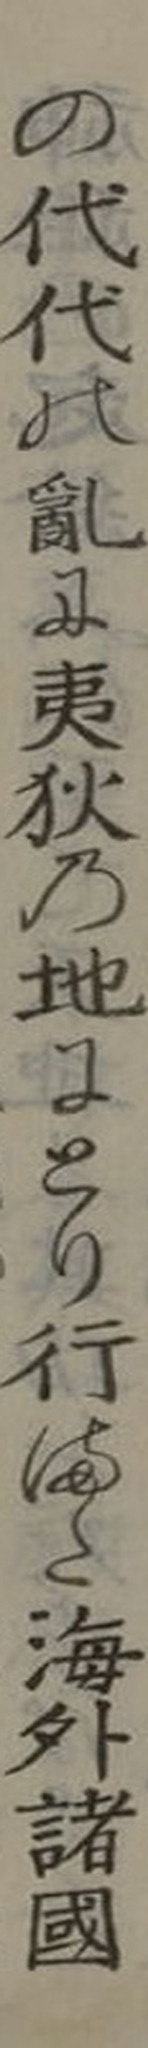の代代の亂に夷狄の地にとり行また海外諸國

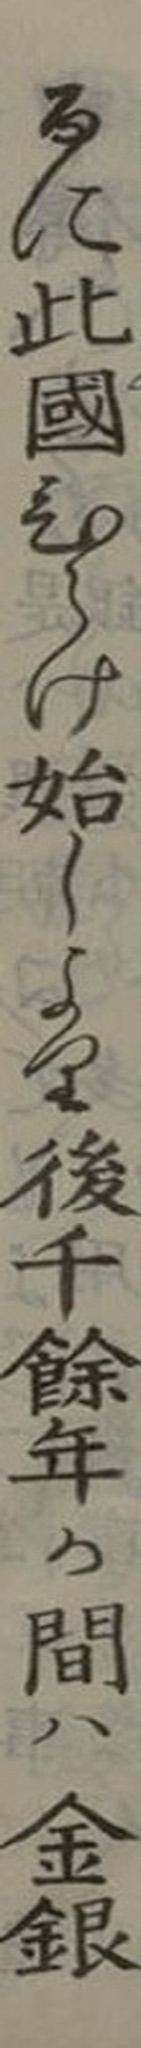るに此國ひらけ始しより後千餘年か間は金銀
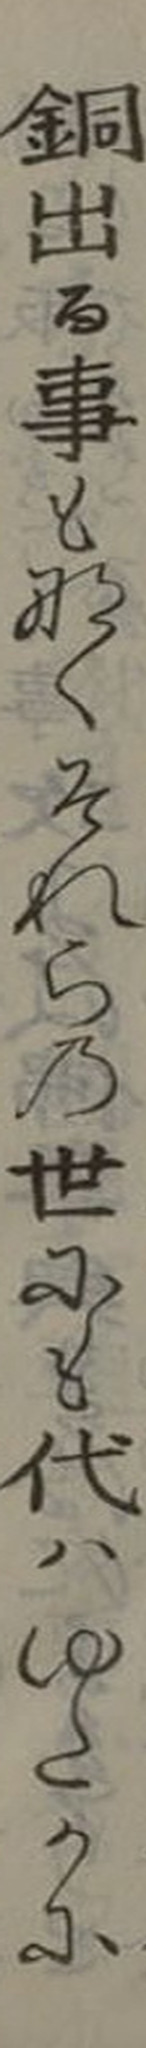銅出る事もなくそれらの世にも代はゆたかに
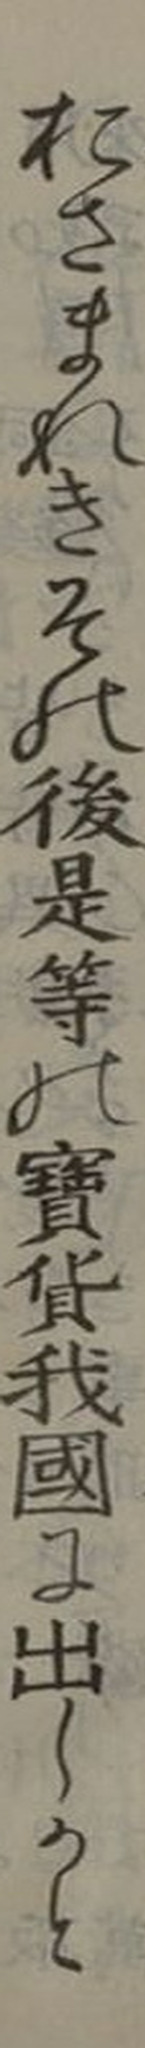おさまれきその後是等の寶貨我國に出しかと
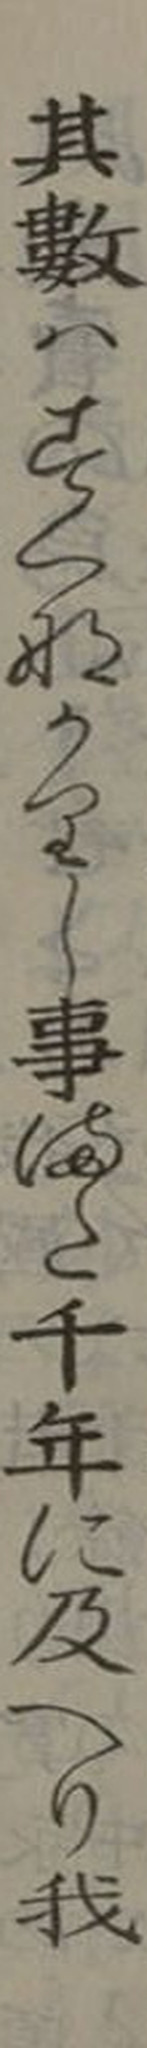其數はすくなかりし事また千年に及へり我
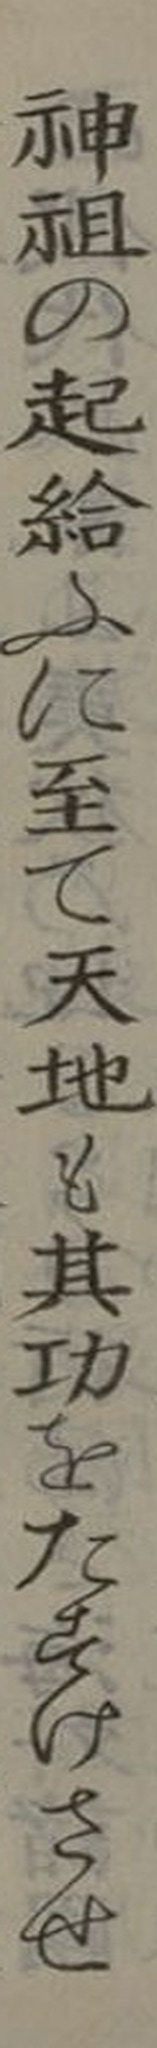神祖の起給ふに至て天地も其功をたすけさせ
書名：骨董録
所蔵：University of the Ryukyus Library
